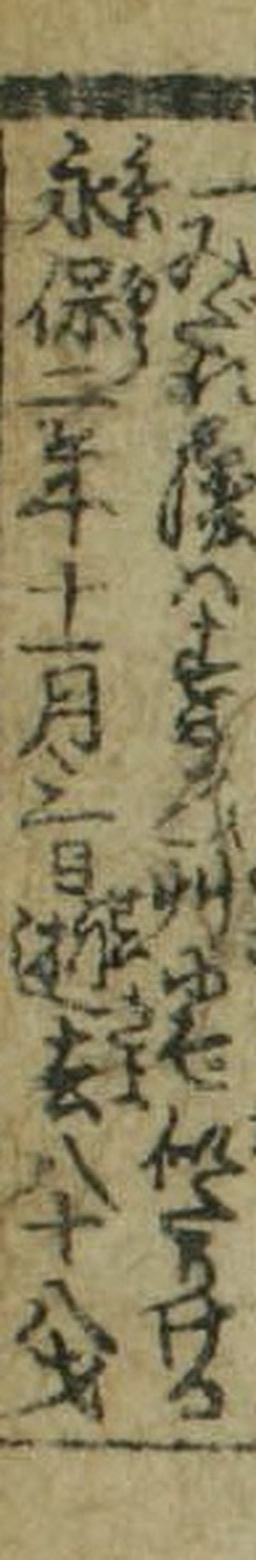永保二年十一月三日逝去八十八才

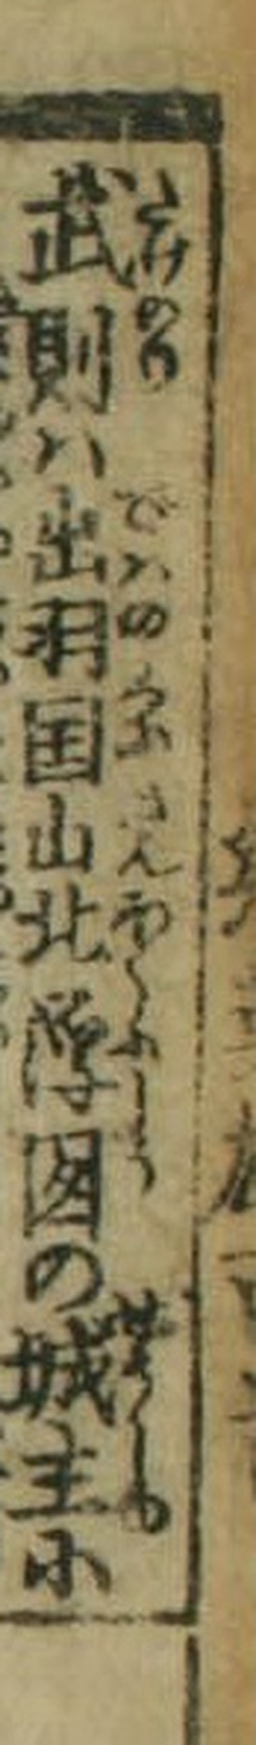武則は出羽国山北俘囚の城主に
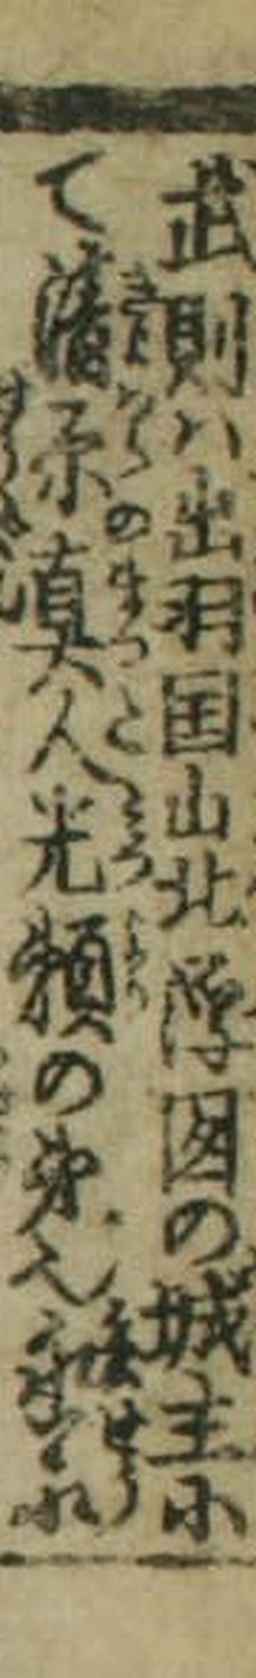て清原真人光頼朝の弟也永承
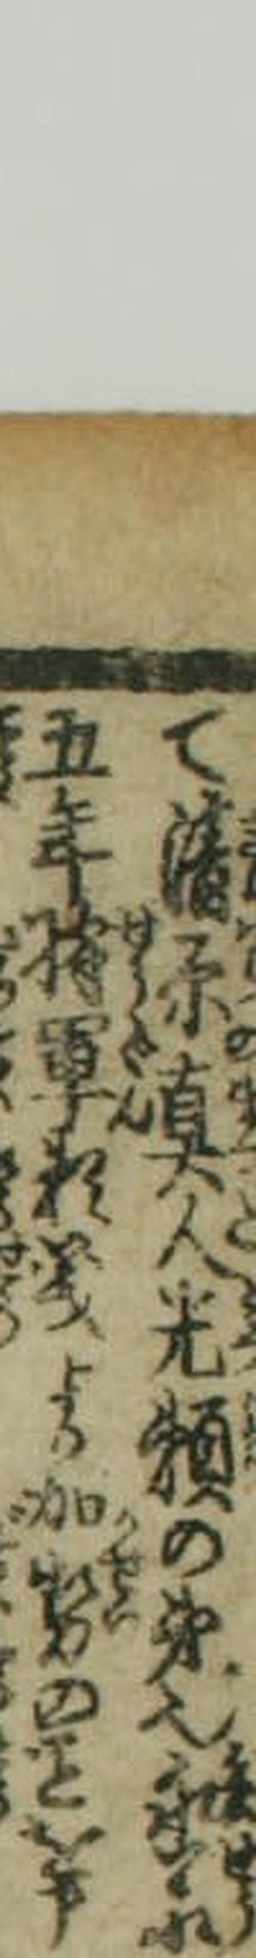五年将軍頼義より加勢のことを申
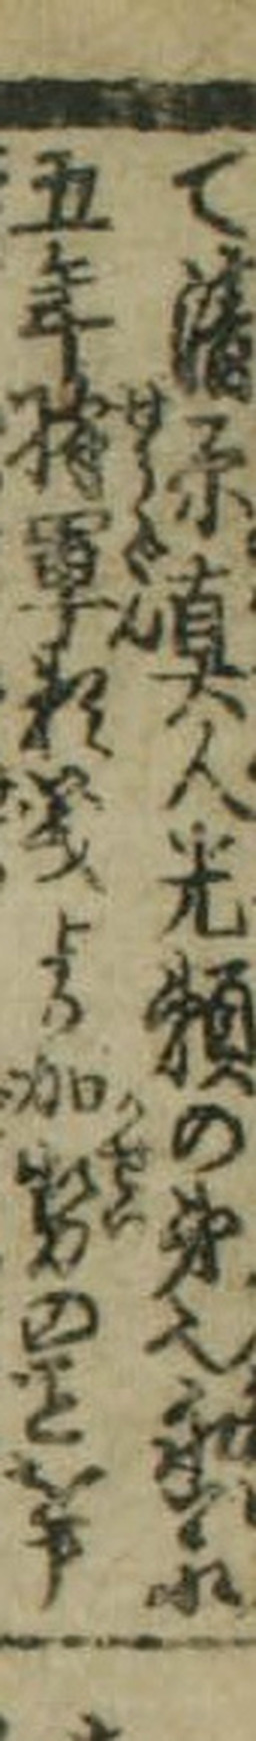五年将軍頼義より加勢のことを申
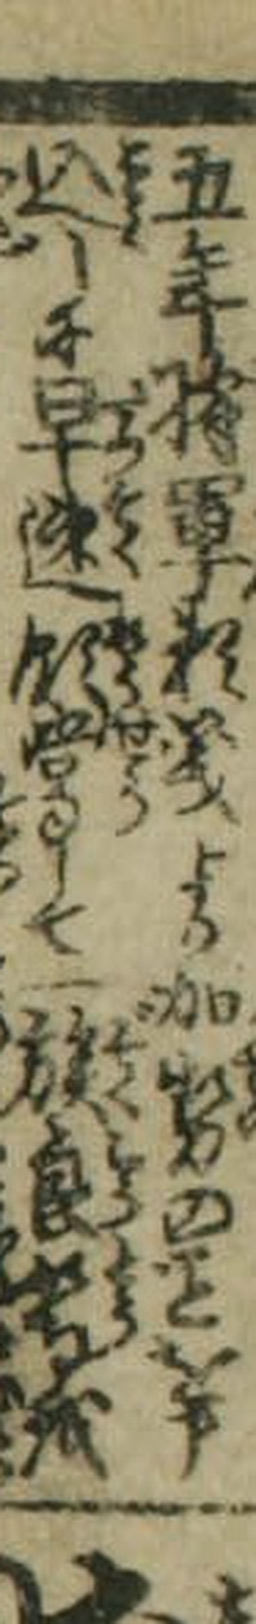込しに早速領掌して一族良等を
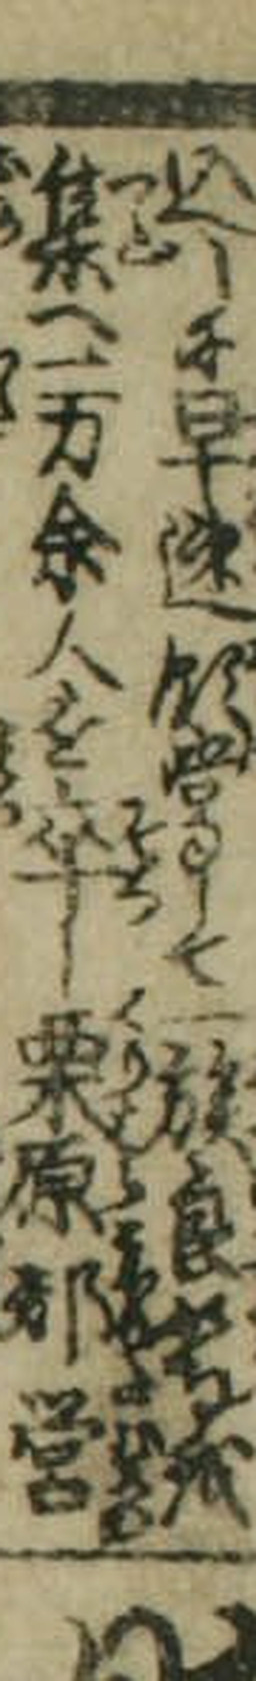集へ一万余人を卒し栗原郡営
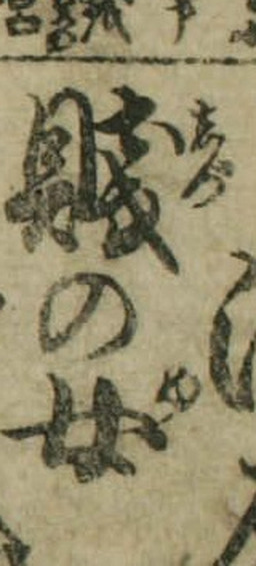賤の女
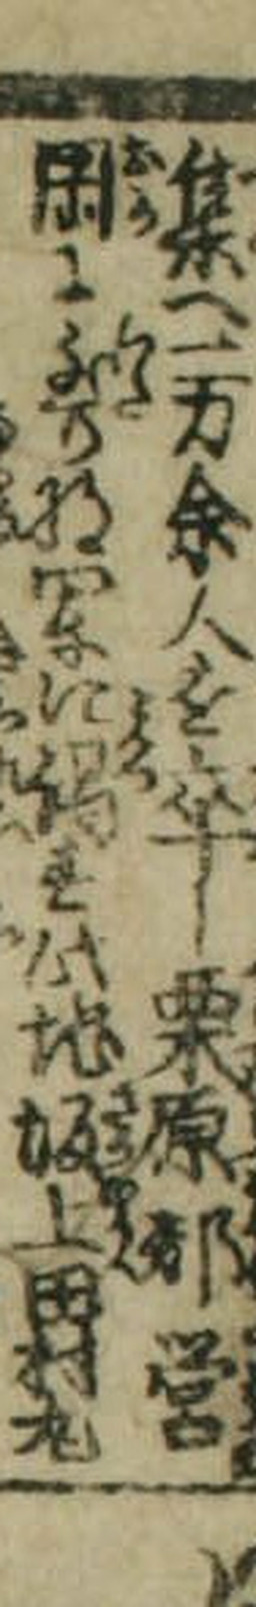岡に至り将軍に謁す此地坂上田村丸
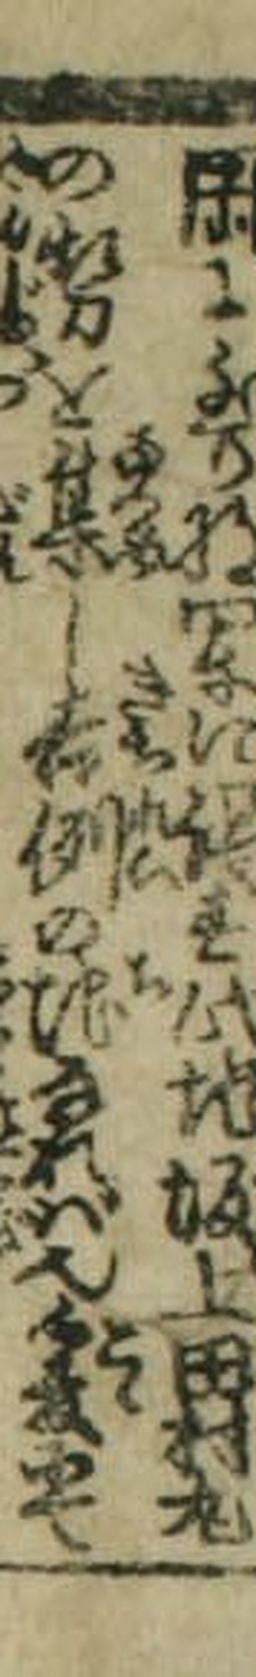の勢を集し吉例の地なれば也爰にて
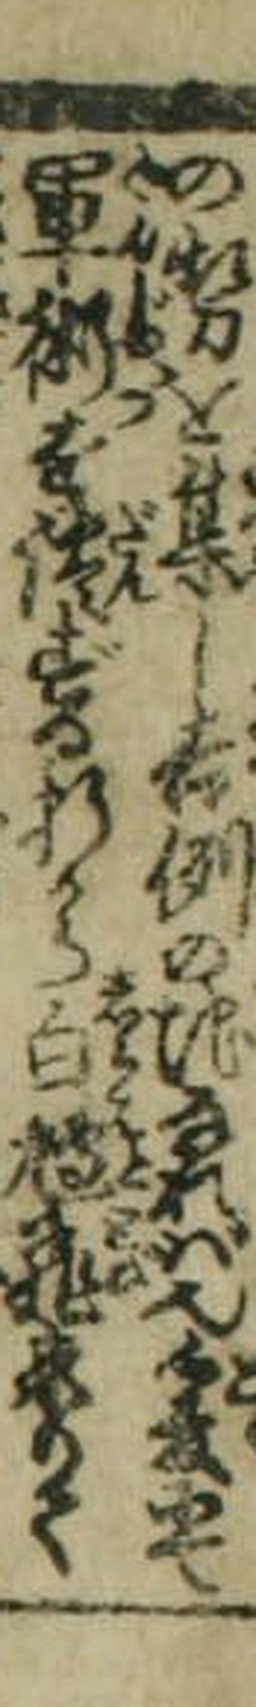軍術を談ずる折から白鳩飛来りて
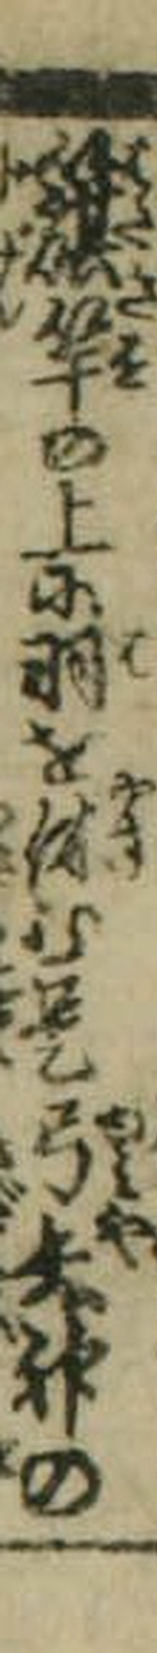旗竿の上に羽を休む是弓矢神の
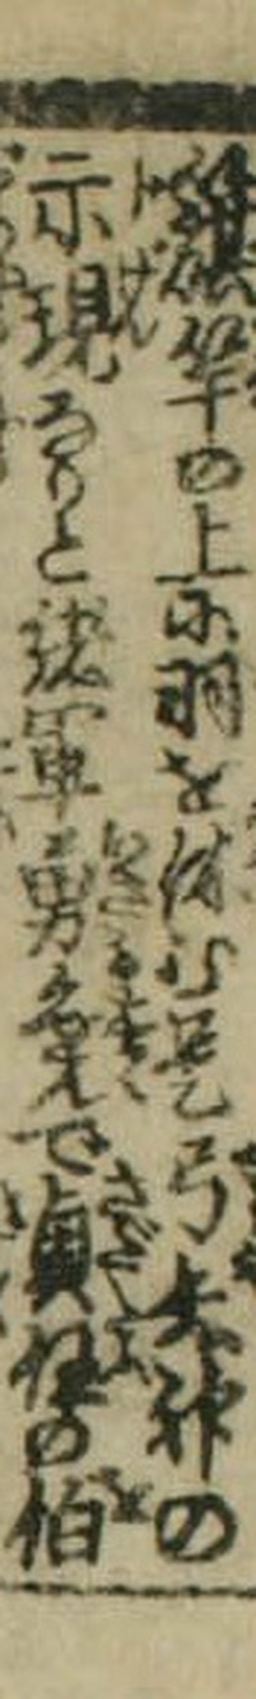示現なりと諸軍勇進んで貞任の伯
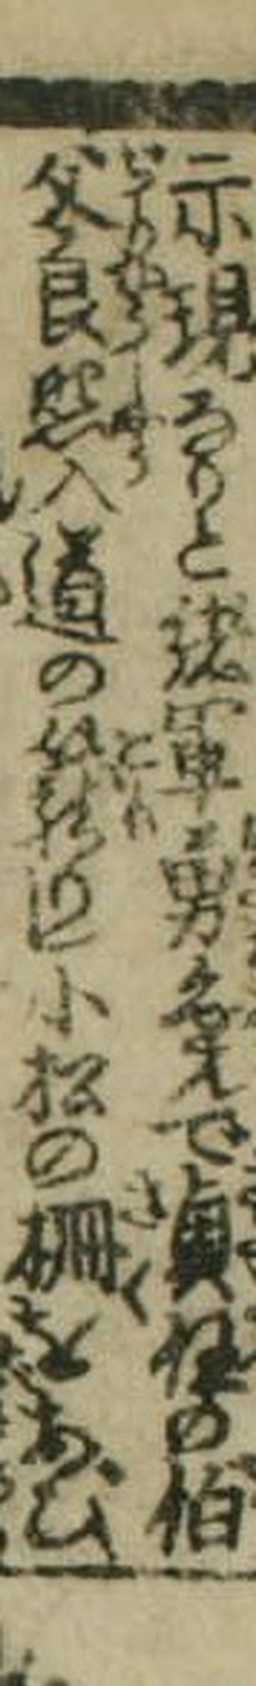父良照入道の籠りし小松の柵をおび
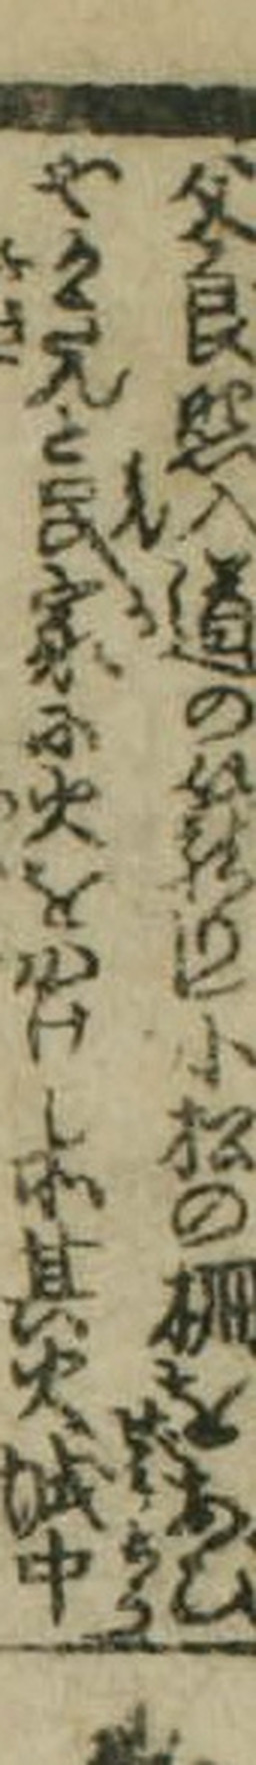やかさんと民家に火をかけし所其火城中
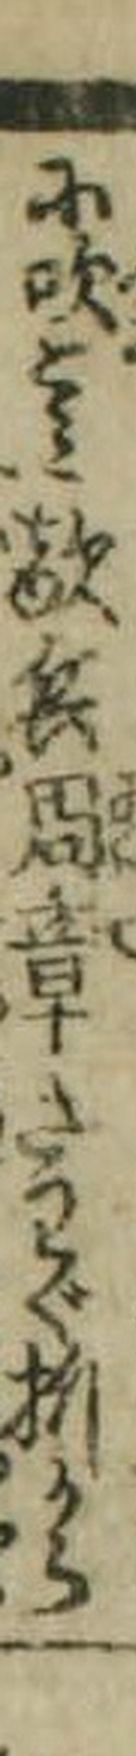に吹こみ敵兵周章さわぐ折から
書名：續英雄百人一首
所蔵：東京学芸大学附属図書館
